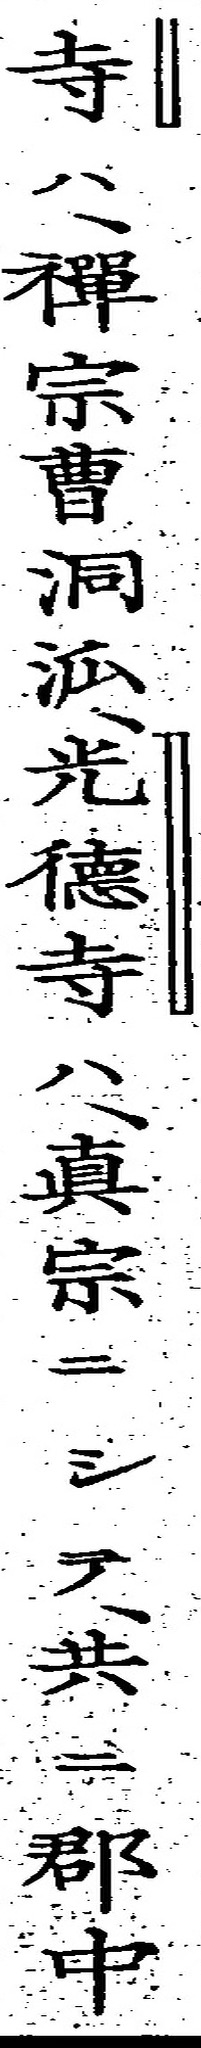寺ハ、禅宗曹洞派、光徳寺ハ、真宗ニシテ、共ニ郡中
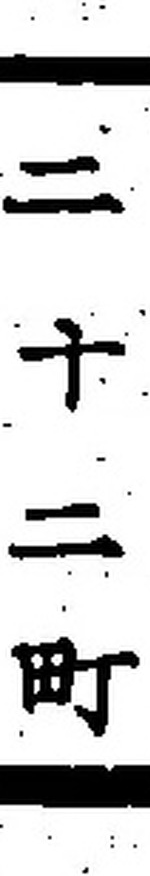二十二町
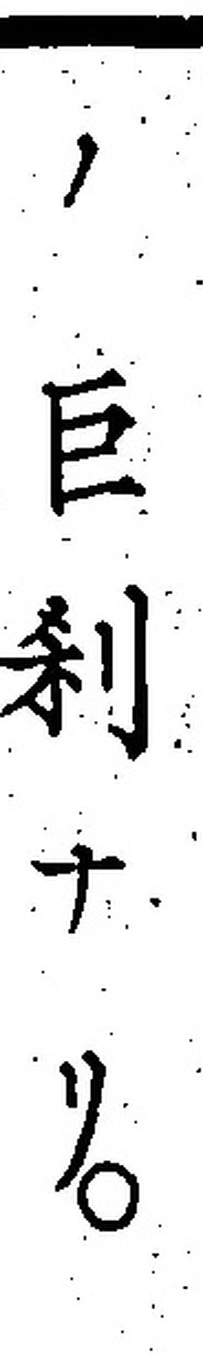ノ巨刹ナリ。
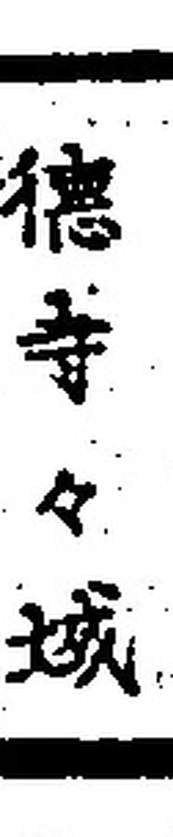徳寺々域
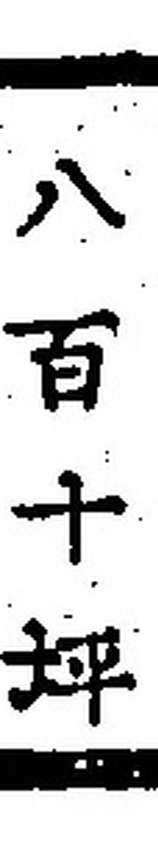八百十坪

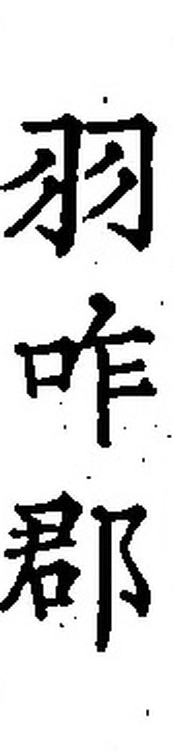羽咋郡
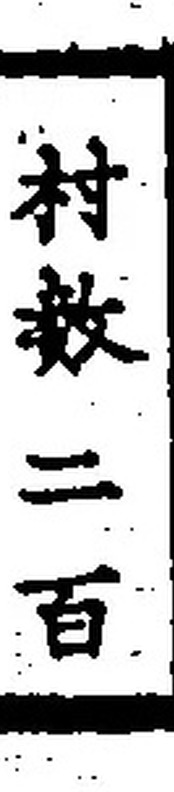村数二百
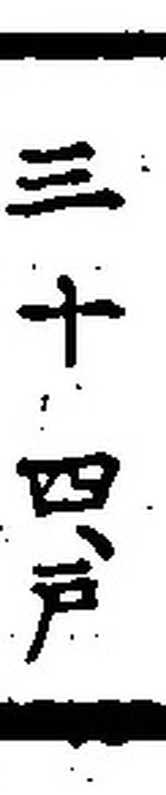三十四、戸
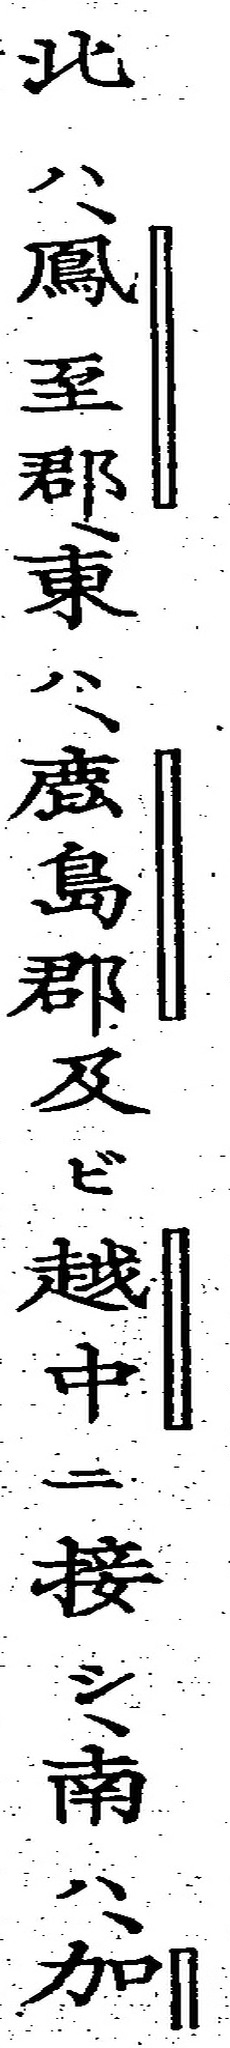北ハ、鳳至郡、東ハ、鹿島郡及ビ越中ニ接シ、南ハ、加
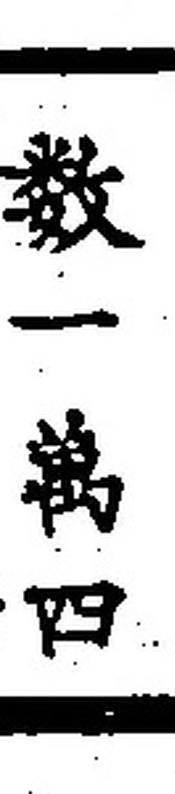数一万四
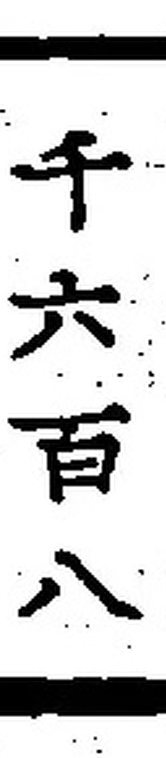千六百八
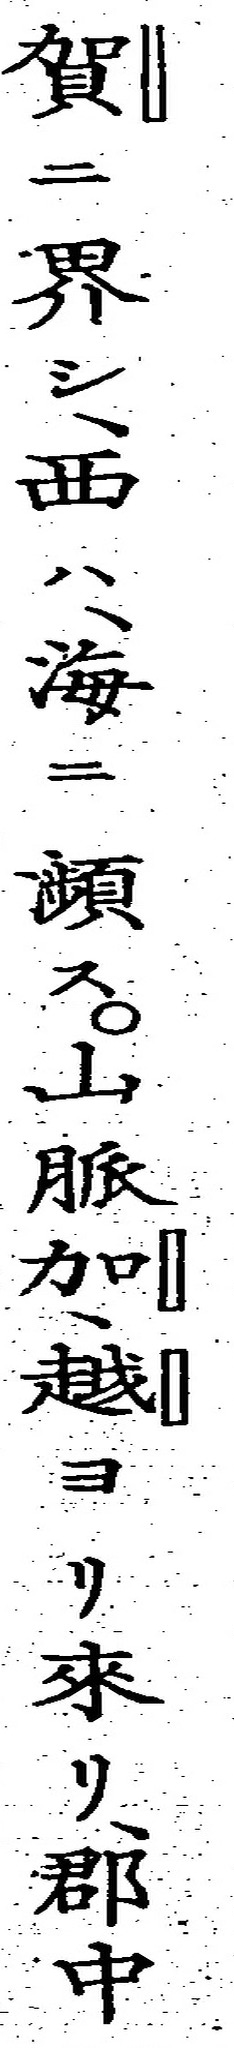賀ニ界シ、西ハ、海ニ瀕ス。山脈加・越ヨリ来リ、郡中
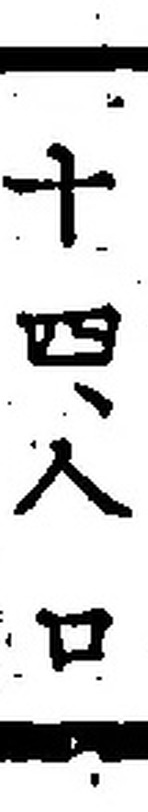十四、人口
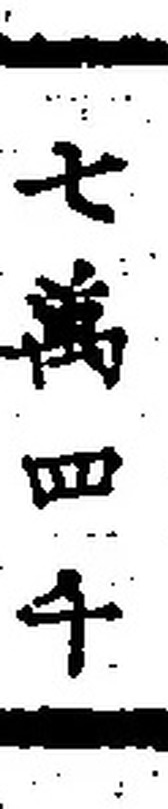七万四千
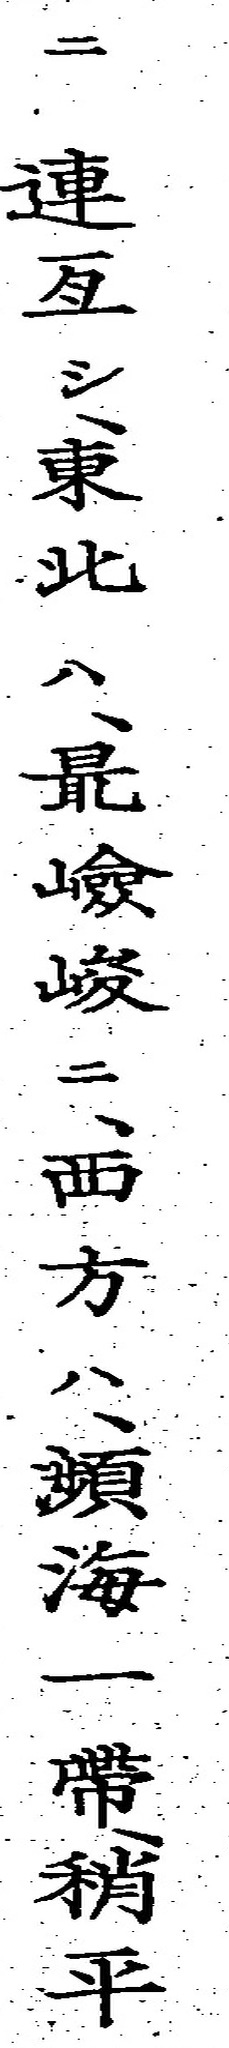ニ連亙シ、東北ハ、最嶮峻ニ、西方ハ、瀕海一帯、稍平
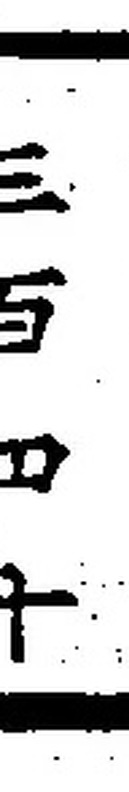三百四十
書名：能登地誌略
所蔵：国立国会図書館 National Diet Library, JAPAN
